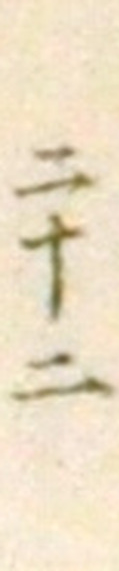二十二

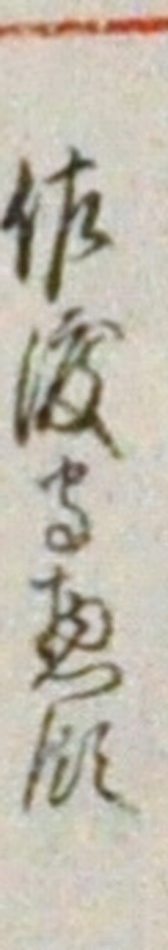佐渡守惣領
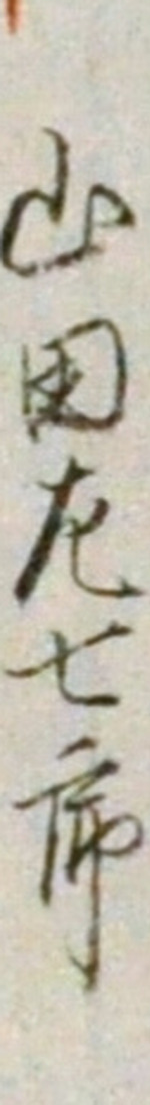山田左七郎
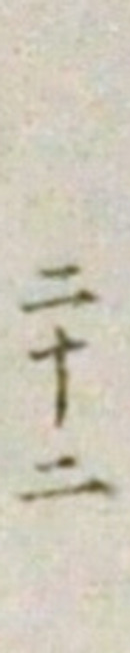二十二
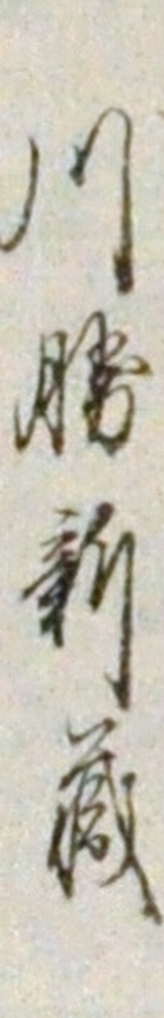川勝新蔵
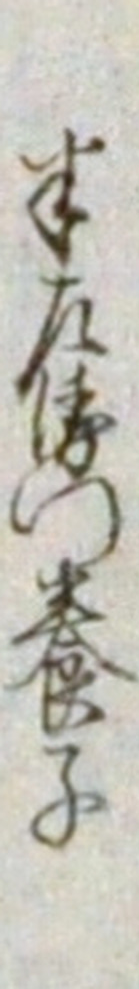半左衛門養子
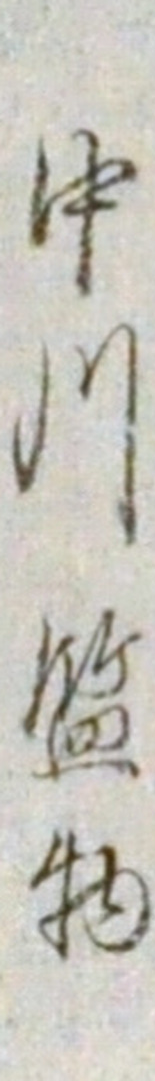中川監物
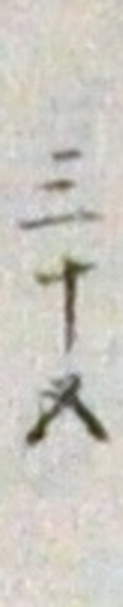三十五
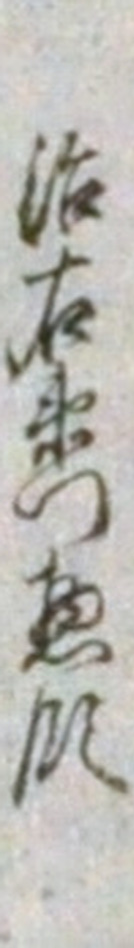治右衛門惣領
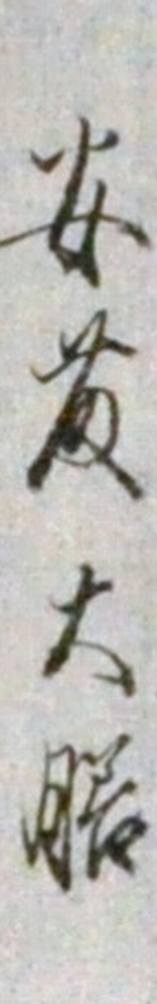安藤大膳
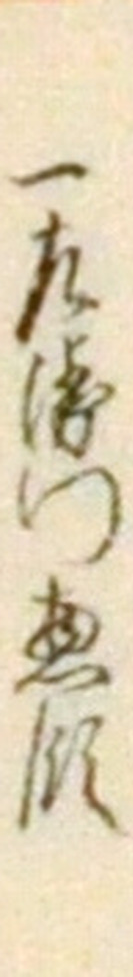一左衛門惣領

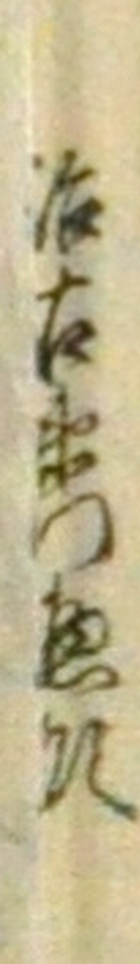治右衛門惣領
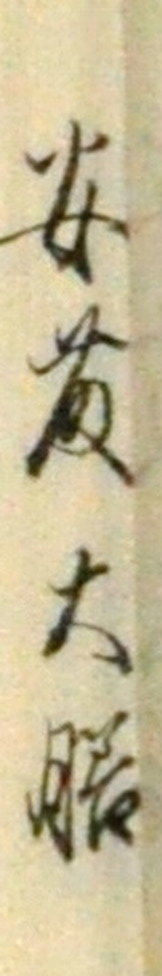安藤大膳
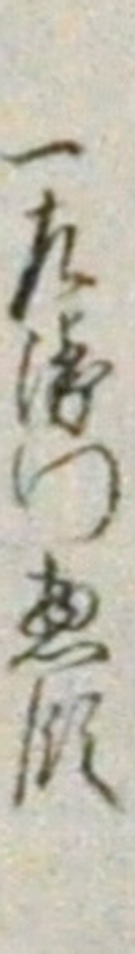一左衛門惣領
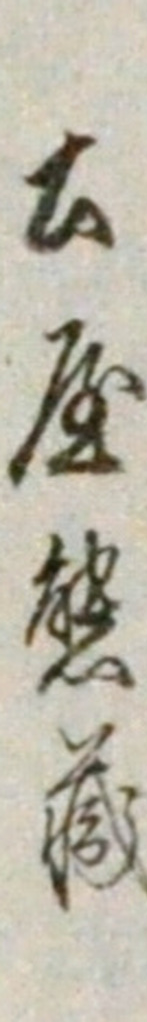土屋熊蔵
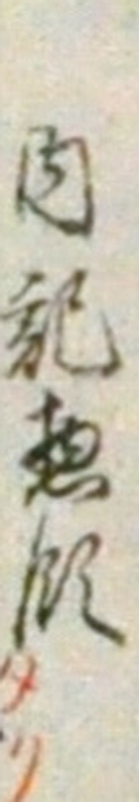内記惣領
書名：若年寄御役中之御書物〔一括〕
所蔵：伊那市立高遠町図書館・合同会社AMANE
